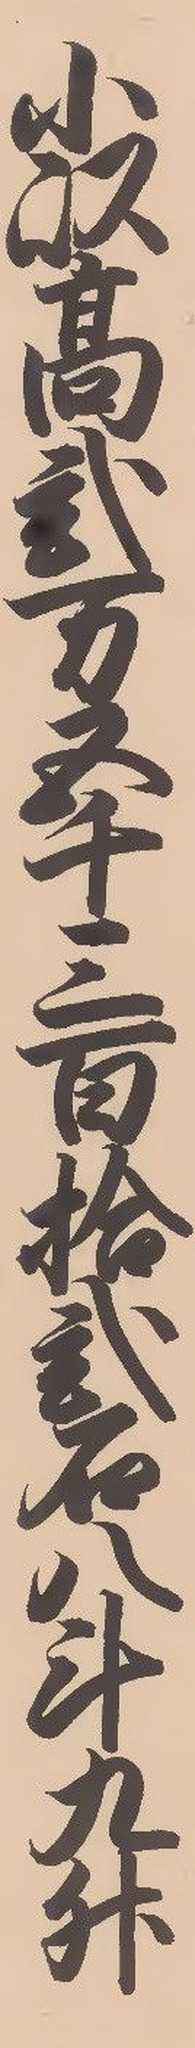小以高弐万五千三百拾弐石八斗九升

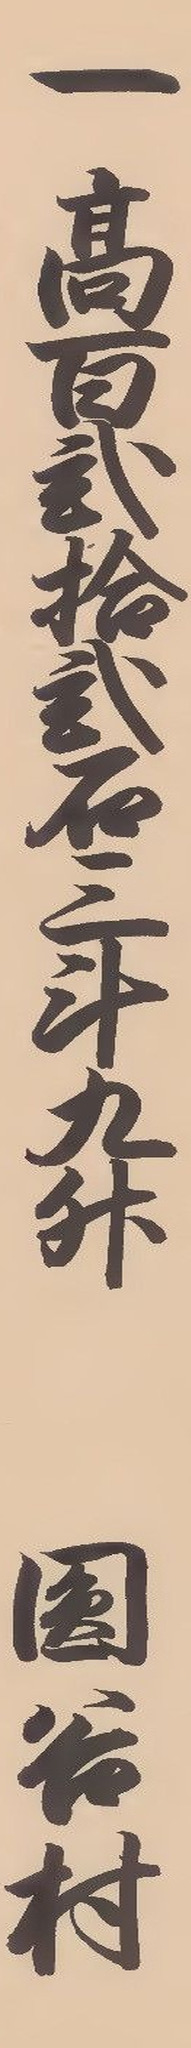一高百弐拾弐石三斗九升円谷村
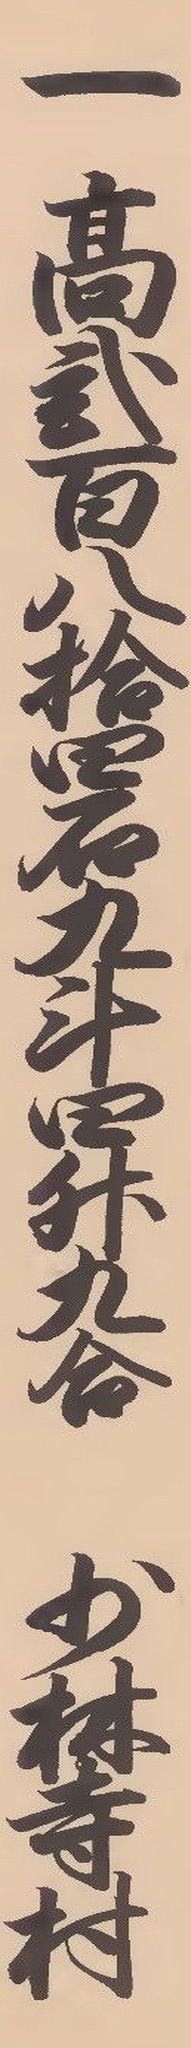一高弐百八拾四石九斗四升九合少林寺村
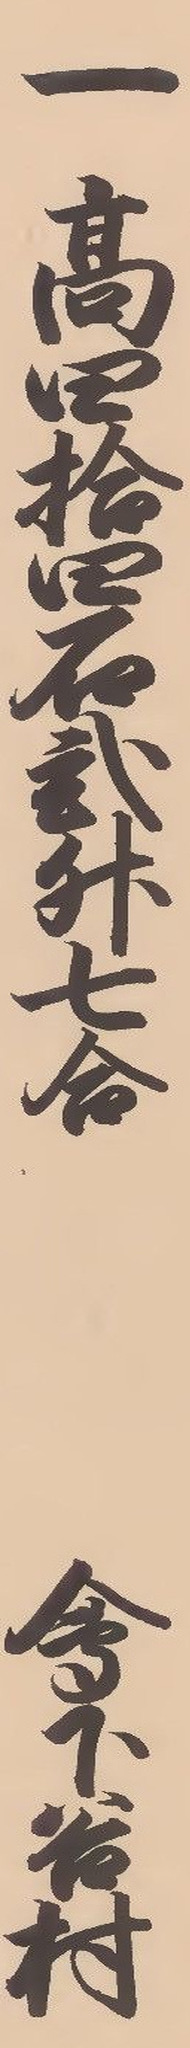一高四拾四石弐升七合会下谷村
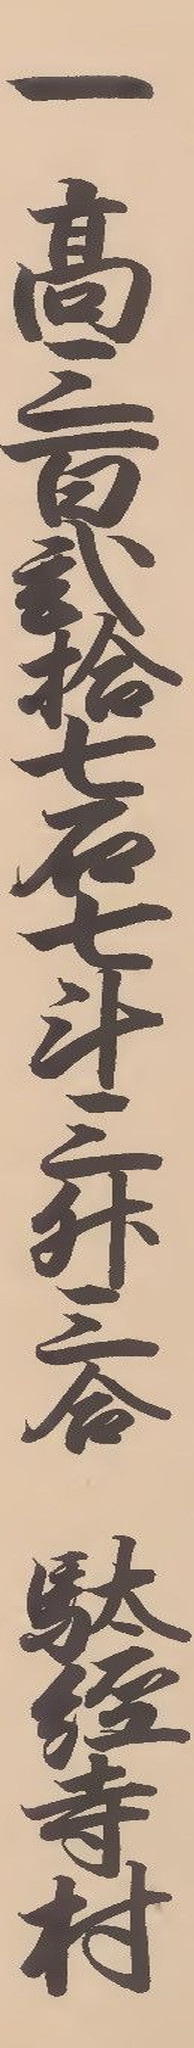一高三百弐拾七石七斗三升三合駄経寺村
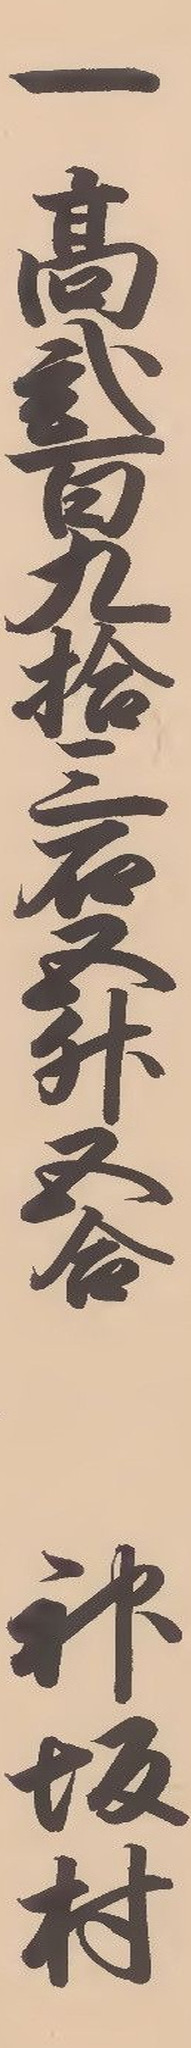一高弐百九拾三石五升五合神坂村
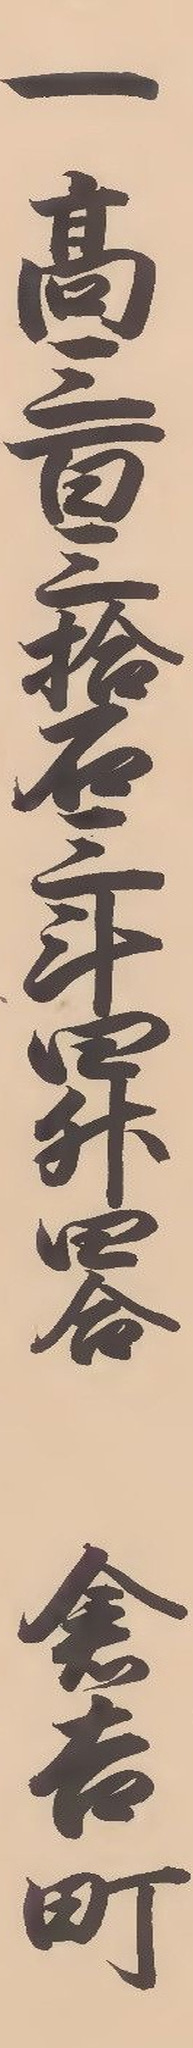一高三百三拾石三斗四升四合倉吉町
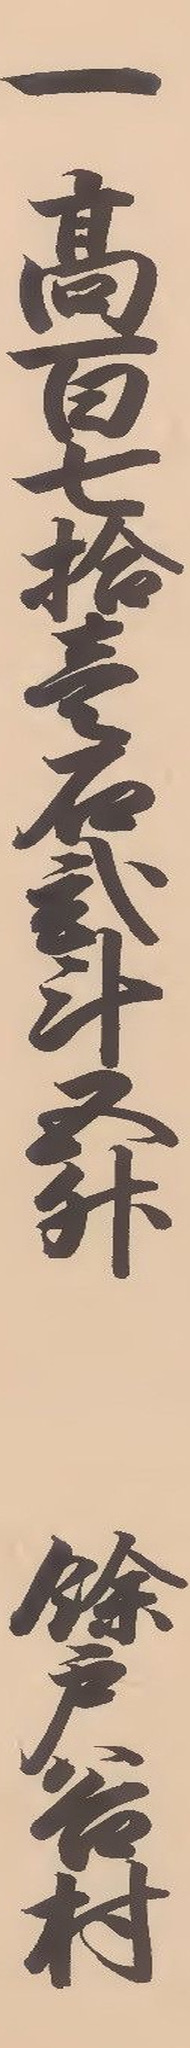一高百七拾壱石弐斗五升余戸谷村

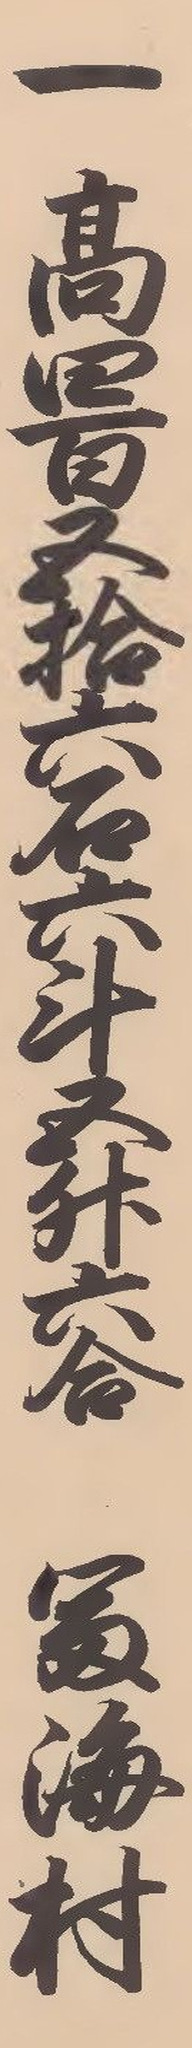一高四百五拾六石六斗五升六合富海村
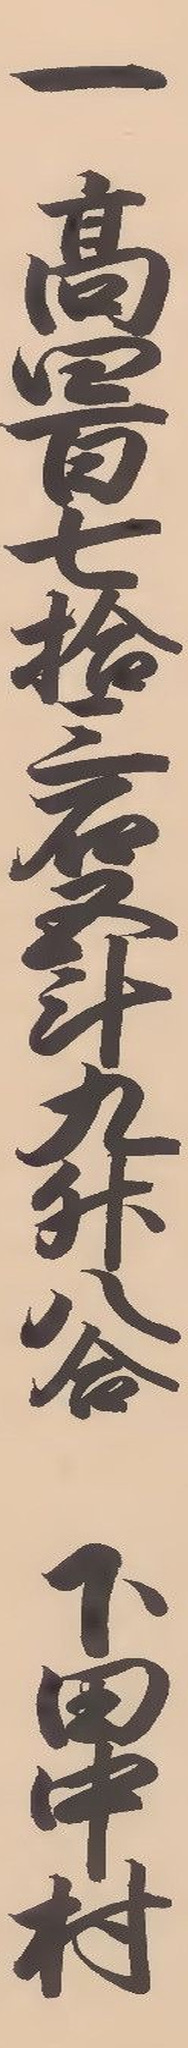一高四百七拾三石五斗九升八合下田中村
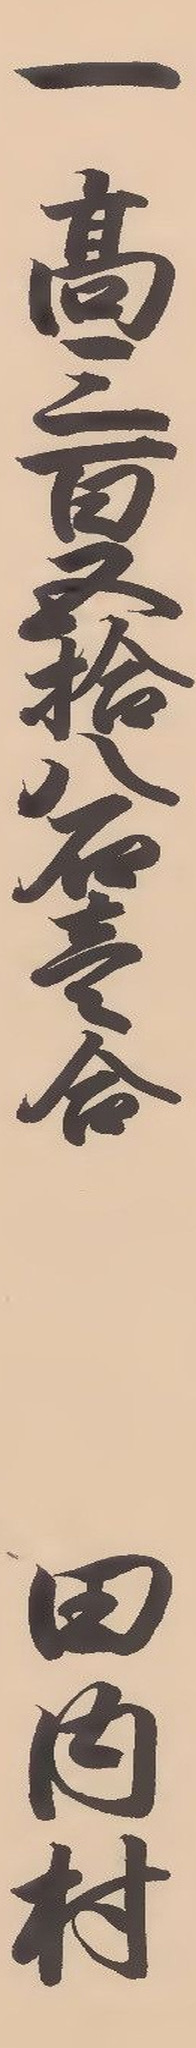一高三百五拾八石壱合田内村
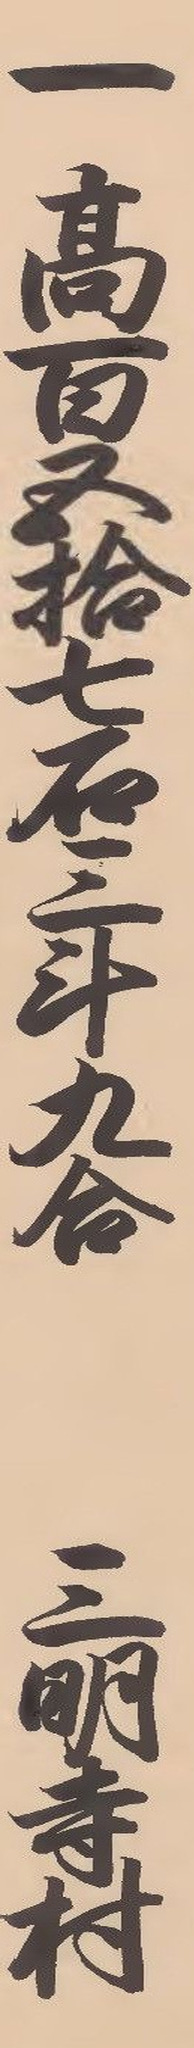一高百五拾七石三斗九合三明寺村
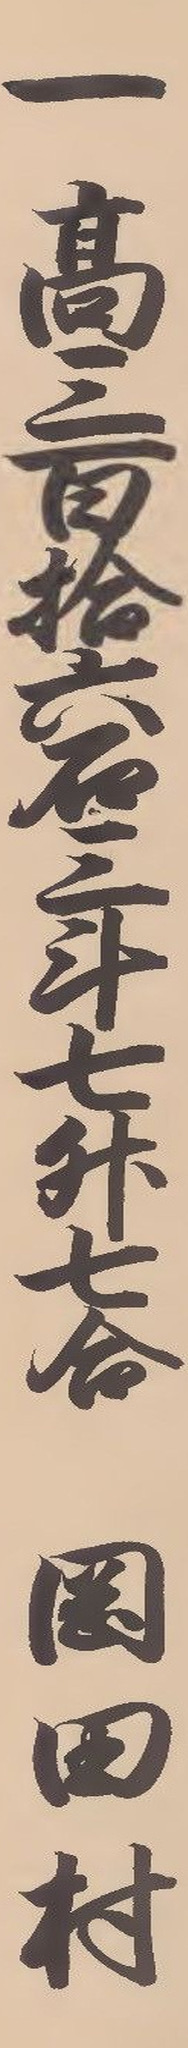一高三百拾六石三斗七升七合岡田村

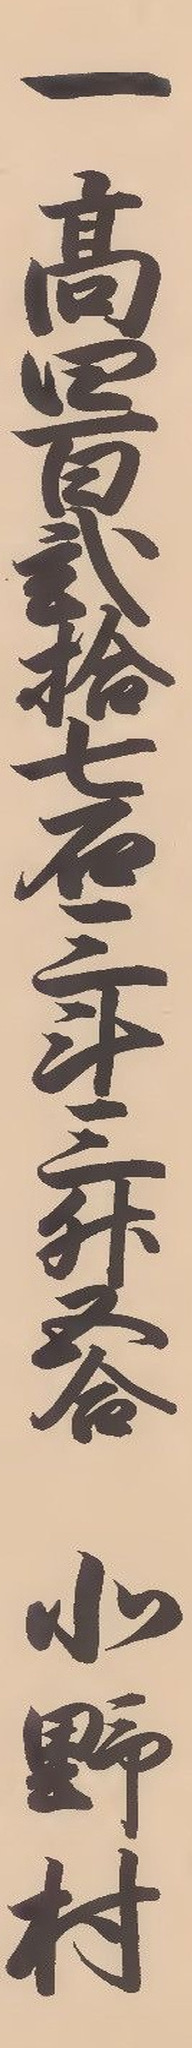一高四百弐拾七石三斗三升五合北野村
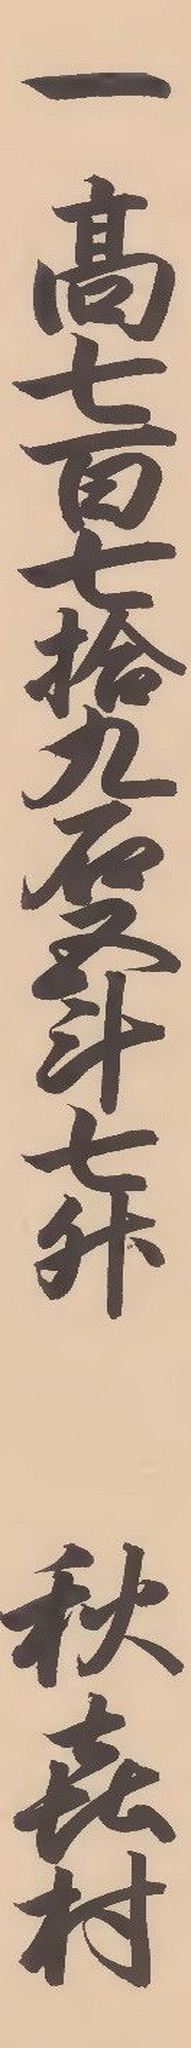一高七百七拾九石五斗七升秋喜村
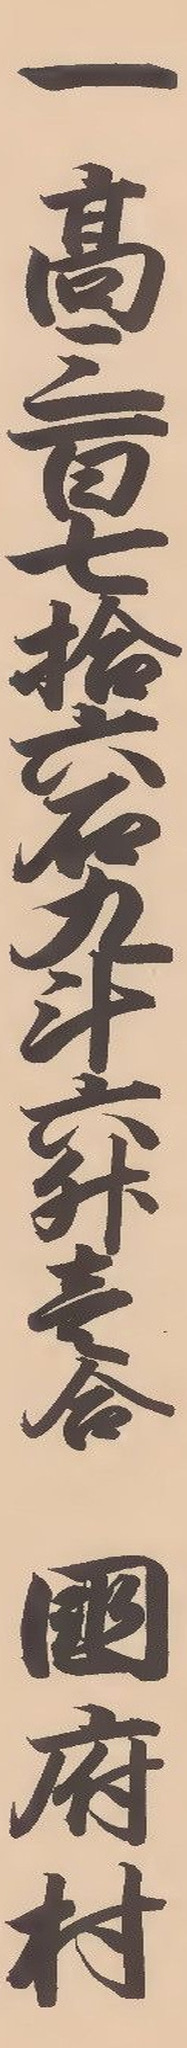一高三百七拾六石九斗六升壱合国府村
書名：伯耆国郷帳
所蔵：国立公文書館 National Archives of Japan
